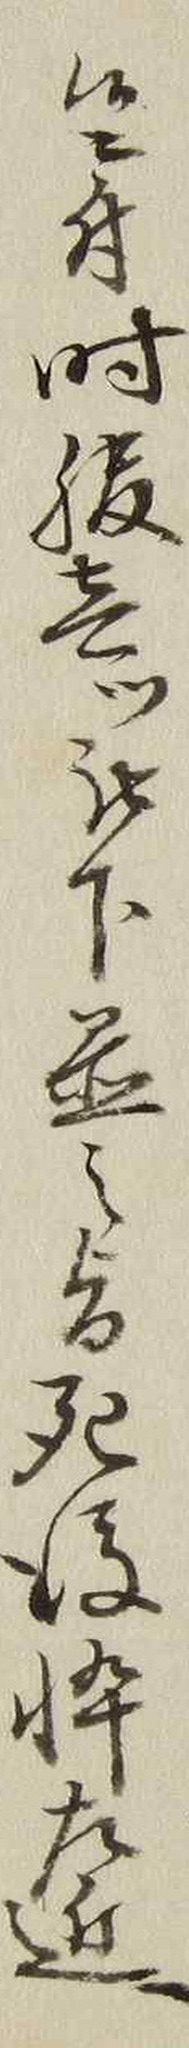候ニ付時服壱ツ被下置之旨死後忰左近へ
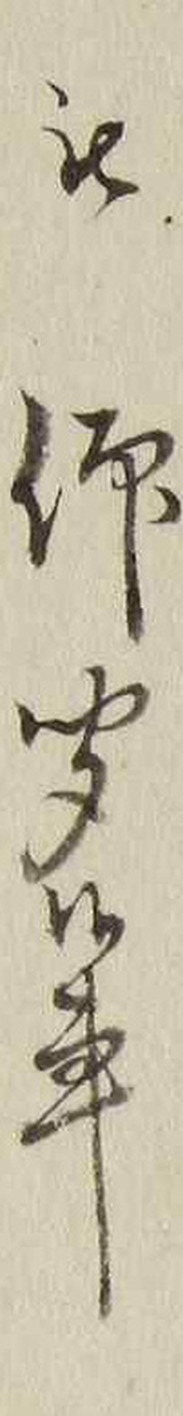被仰聞候事
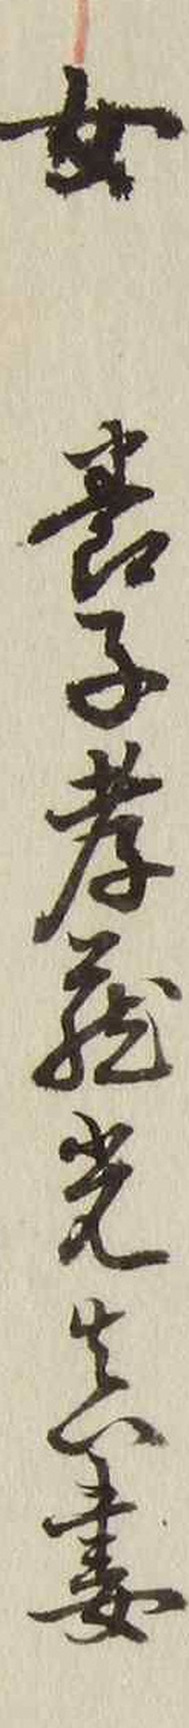女養子孝蔵光真妻
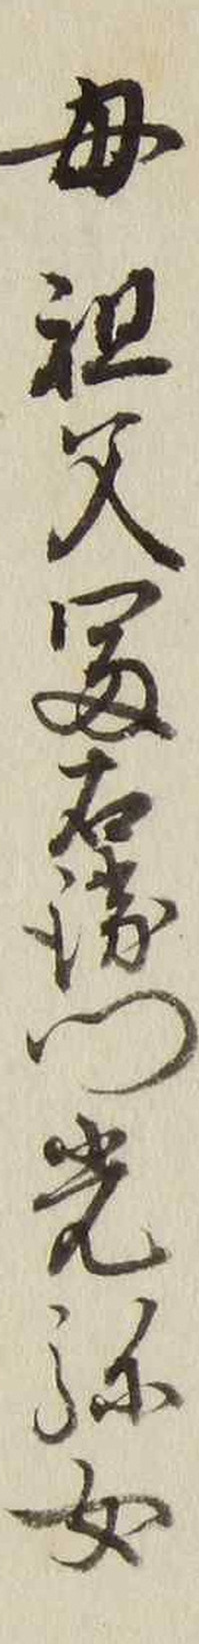母祖父富右衛門光弥女

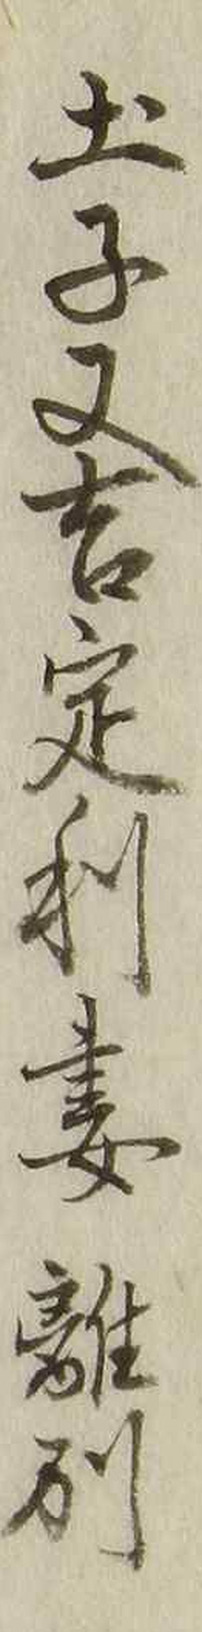女土子又吉定利妻離別
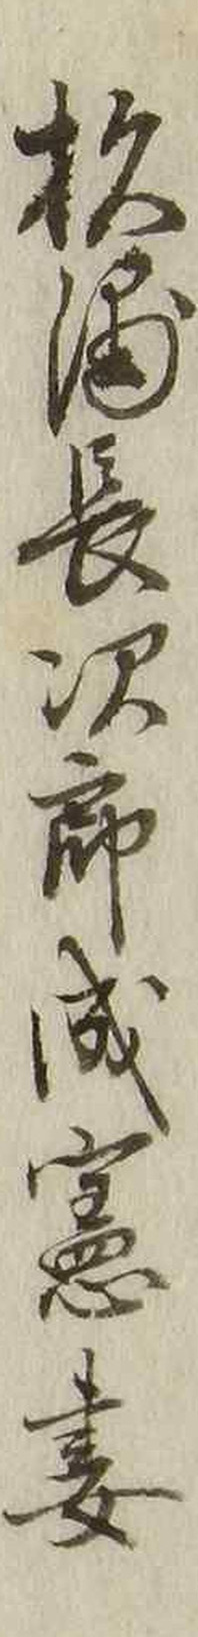杉浦長次郎成憲妻
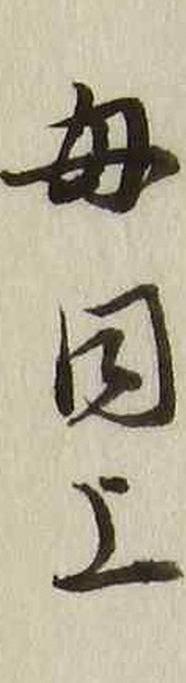母同上
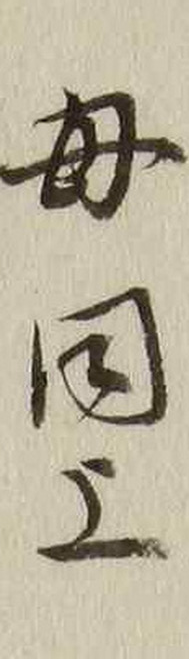母同上
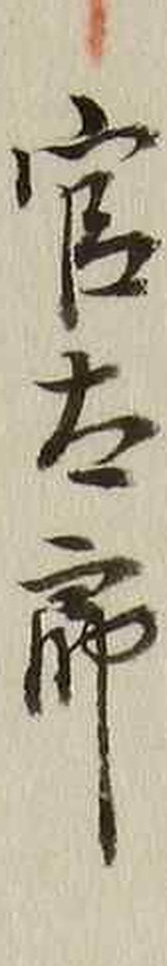官太郎
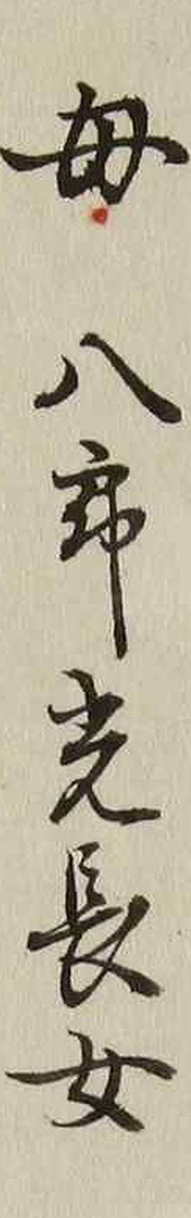母八郎光長女
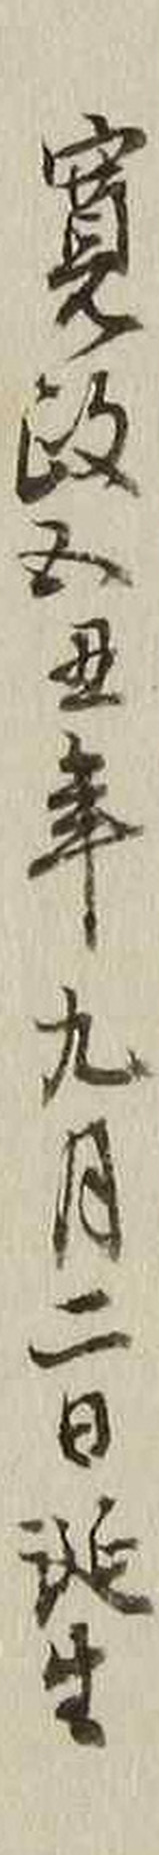寛政五丑年九月二日誕生
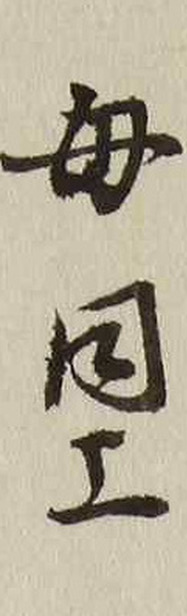母同上
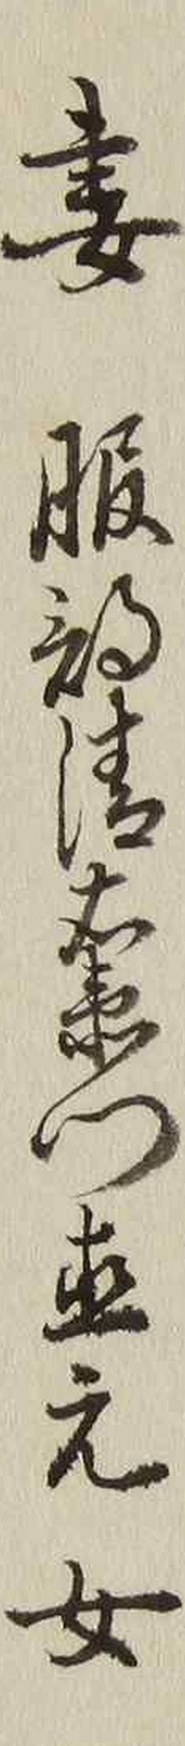妻服部清右衛門直元女
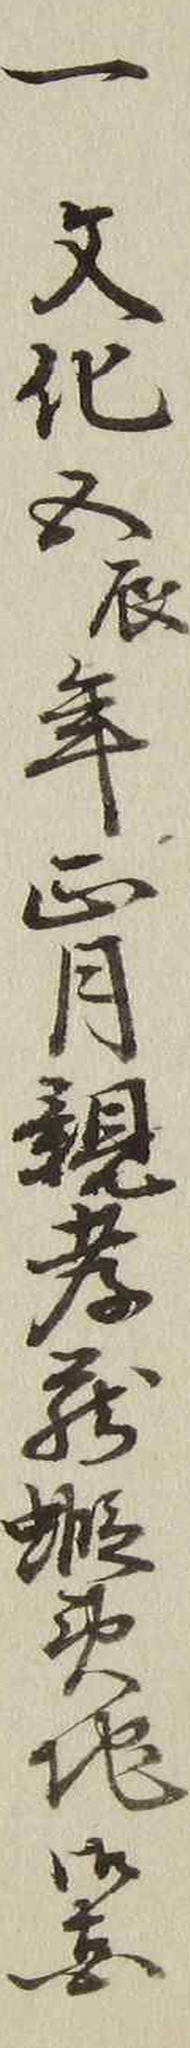一文化五辰年正月親孝蔵蝦夷地御固
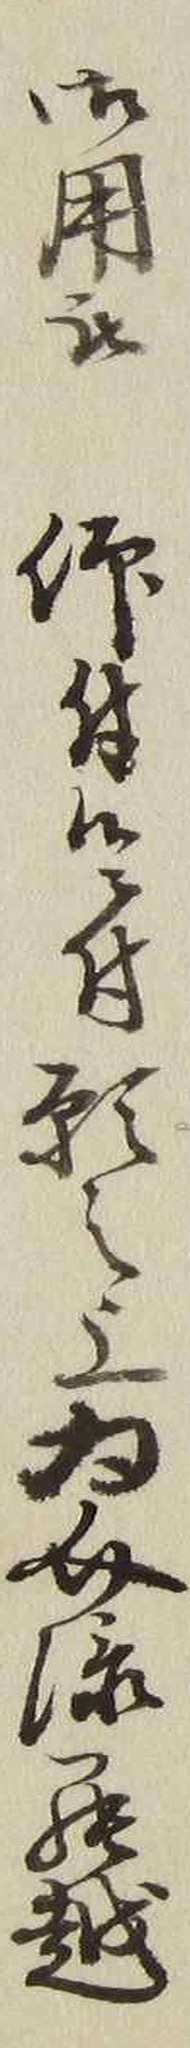御用被仰付候ニ付願之上為介添罷越
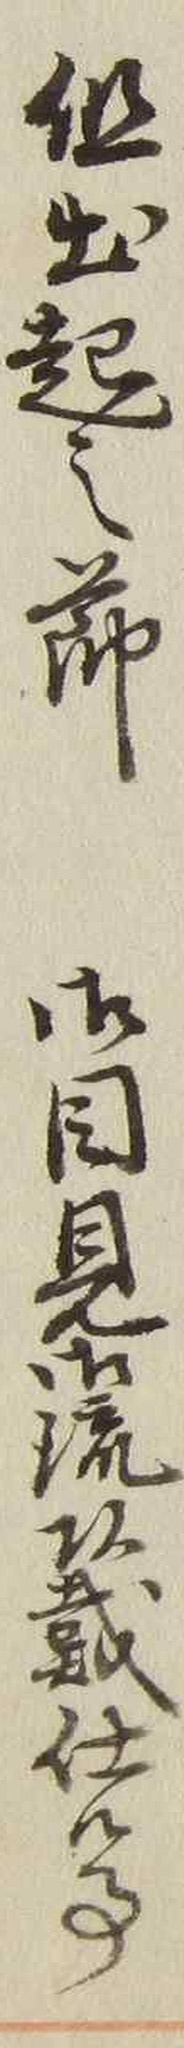但出起之節御目見御流頂戴仕候事
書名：諸士系譜　巻之27　い之部27
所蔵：会津若松市立会津図書館
